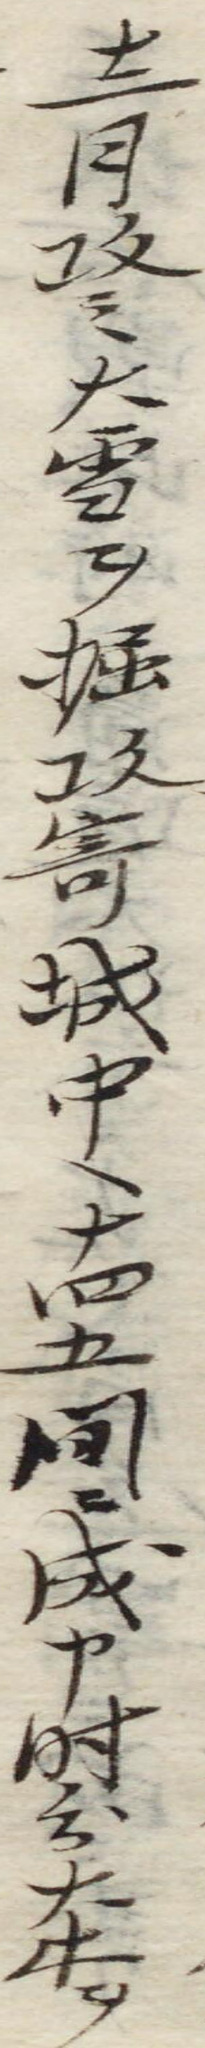十二月攻之大雪ヲ掘攻寄城中ヘ十四五間ニ成申時分大木ヲ
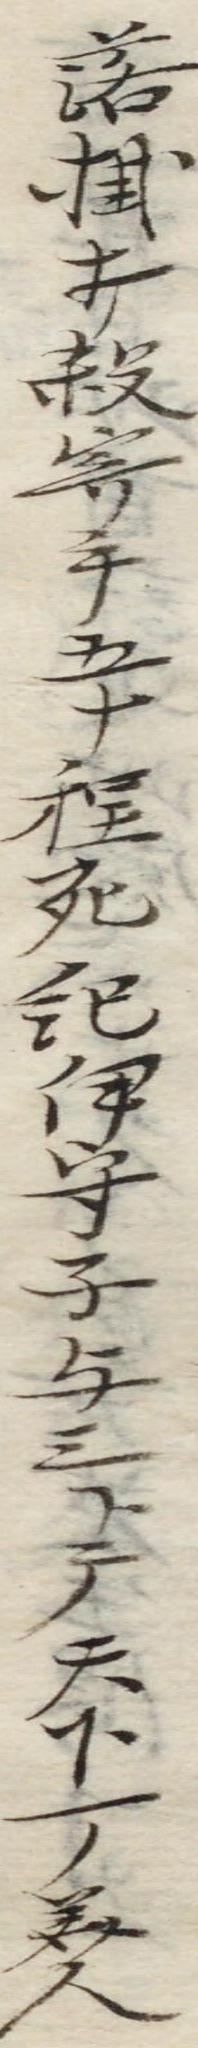落掛打殺寄手五十程死紀伊守子予三トテ天下一ノ美人
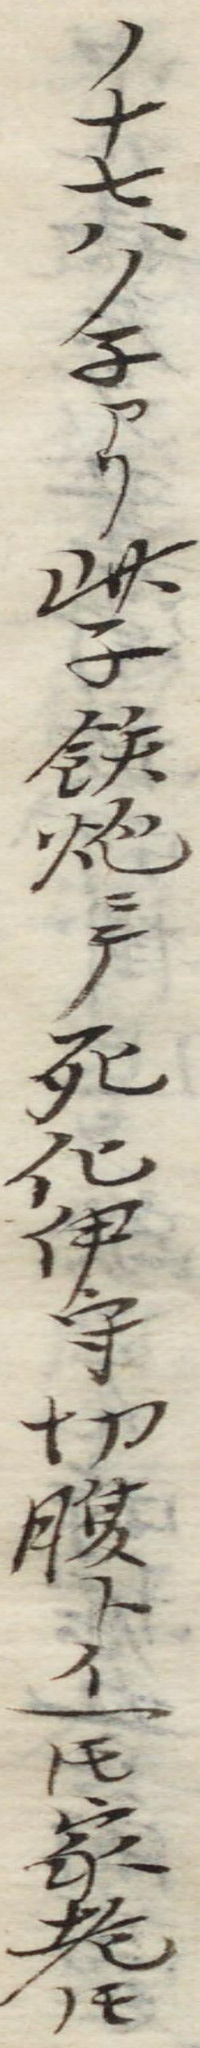ノ十七八ノ子アリ此子鉄炮二テ死紀伊守切腹トイヘトモ家老トモ
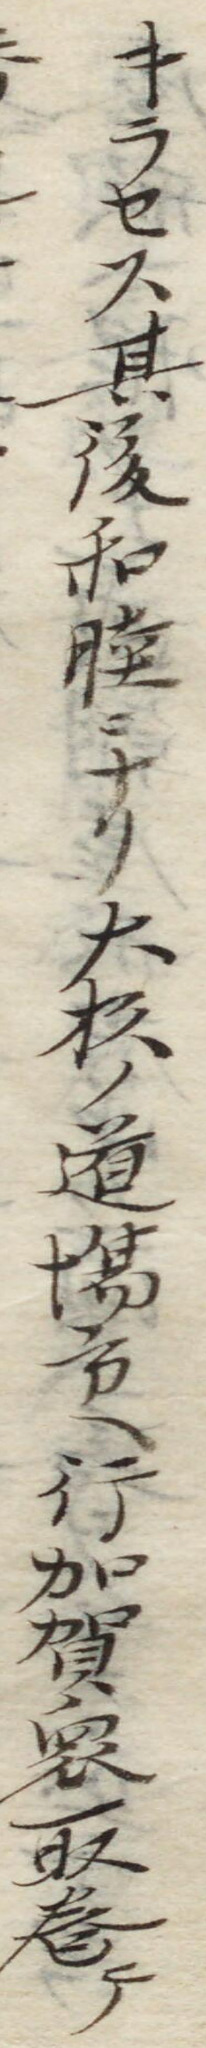キラセス其後和睦ニナリ大杉ノ道場ヘ行加賀衆取巻テ
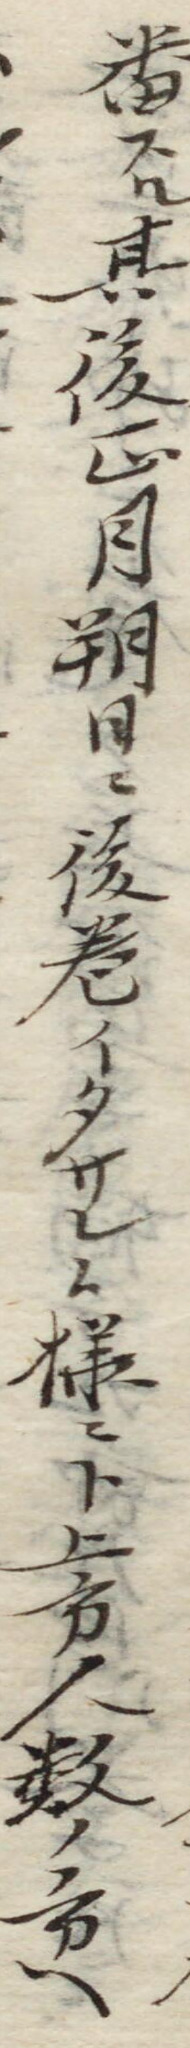番スル其後正月朔日ニ腹巻イタサレゟ様ニト上方人数ノ方へ
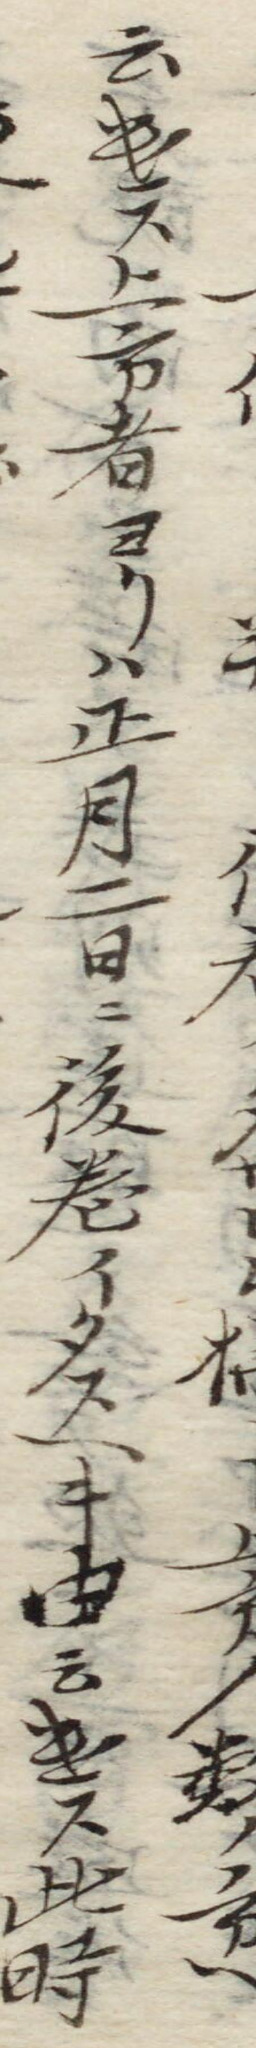云遣ス上方者ヨリハ正月二日ニ腹巻イタスへキ由云遣ス此時
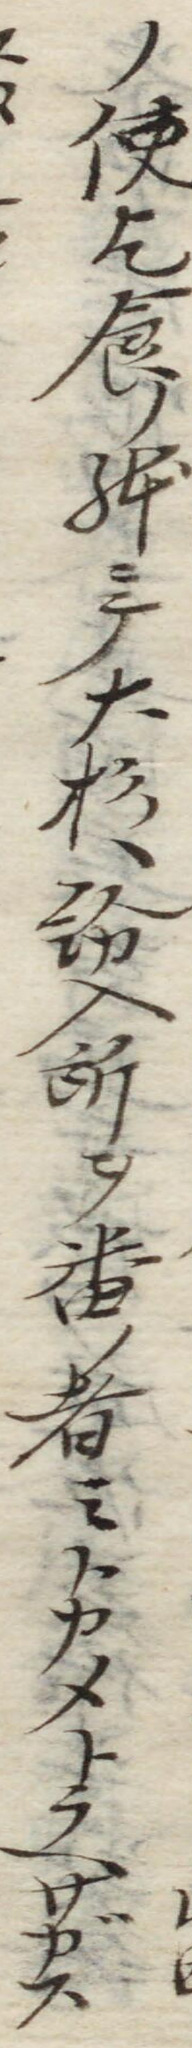ノ使乞食ノ躰ニテ大杉ヘ紛入所ヲ番ノ者ミトカメトラヘサガス
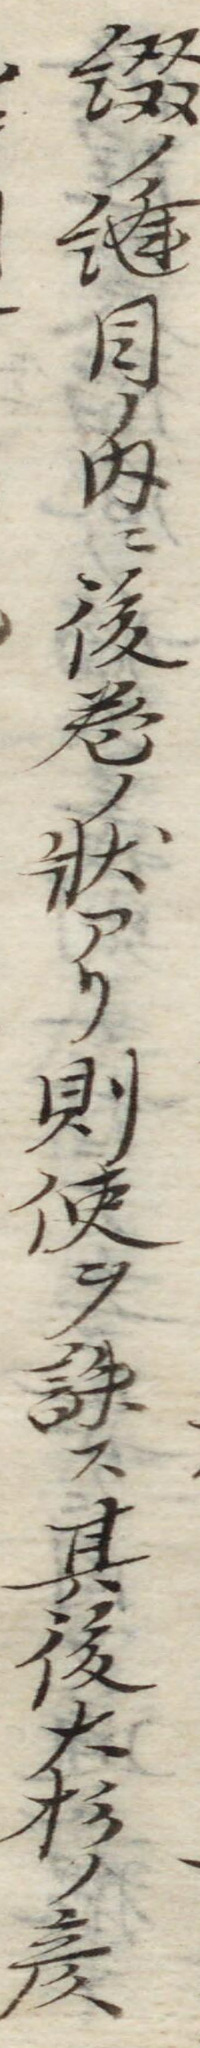綴ノ継目ノ内ニ腹巻ノ状アリ則使ヲ誅ス其後大杉ノ彦
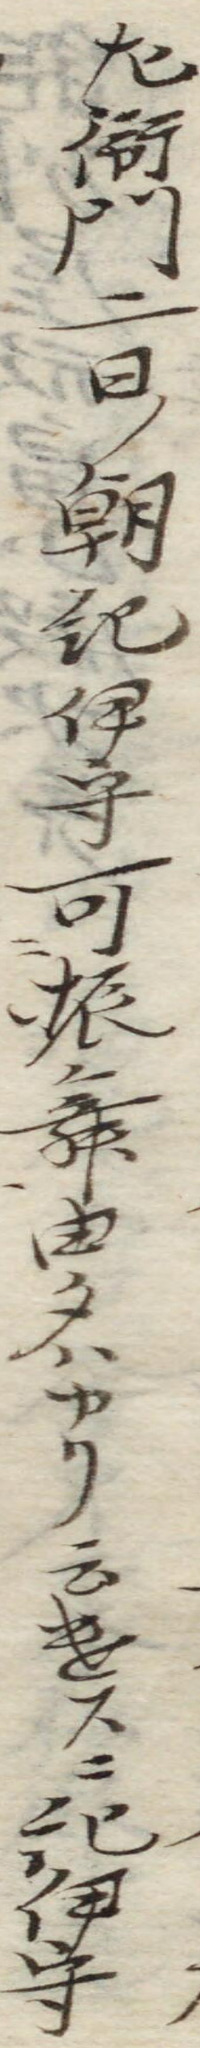左衛門二日ノ朝紀伊守可振舞由タハカリ云遣スニ紀伊守
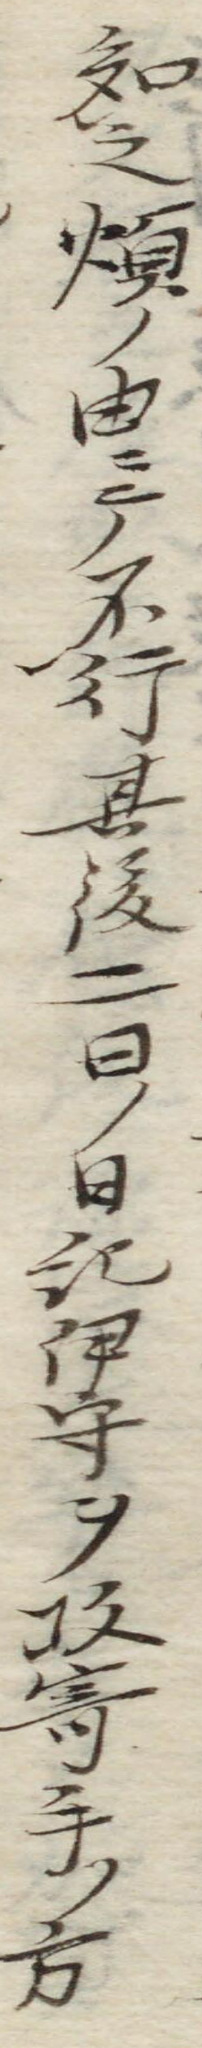知之煩ノ由二テ不行其後二日ノ日紀伊守ヲ攻寄手ノ方
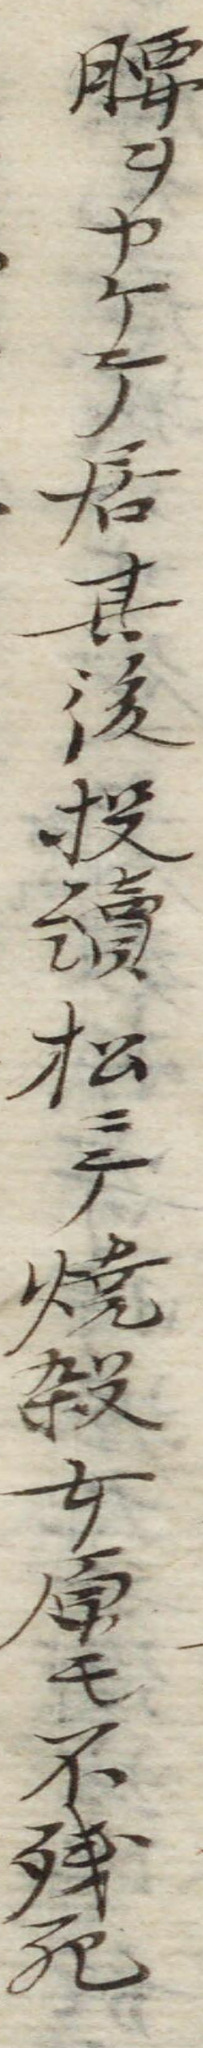腰ヲカケテ居其後投読松二テ焼殺女原モ不残死
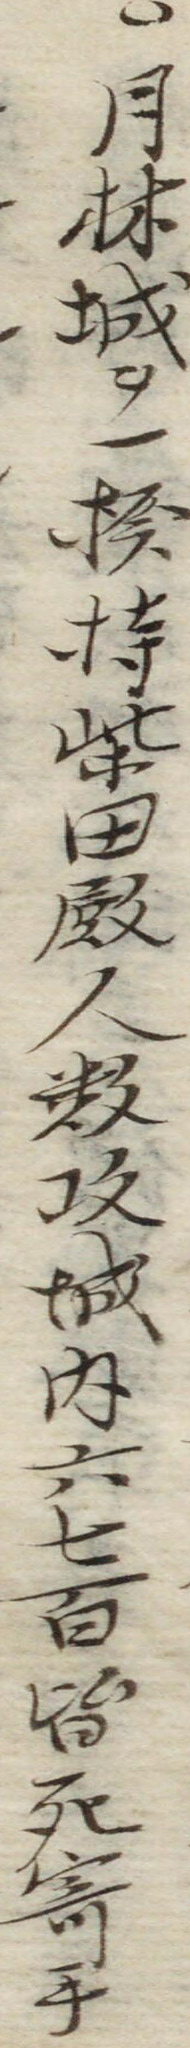〇月林城ヲ一揆持柴田殿人数攻城内六七百皆死寄手
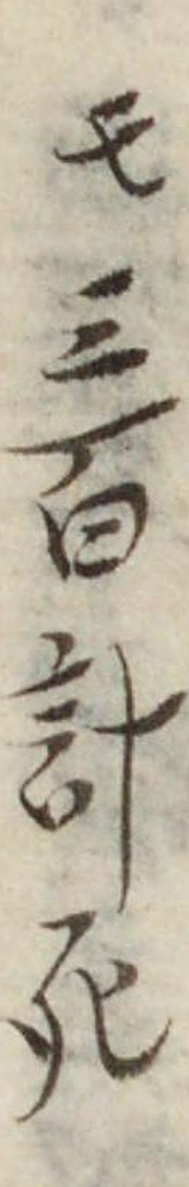モ三百計死

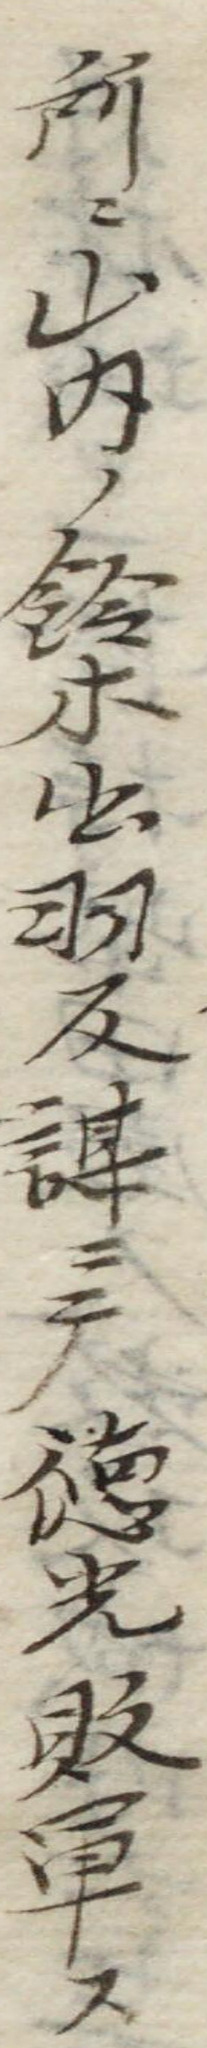所ニ山内ノ鈴木出羽及謀ニテ徳光敗軍ス
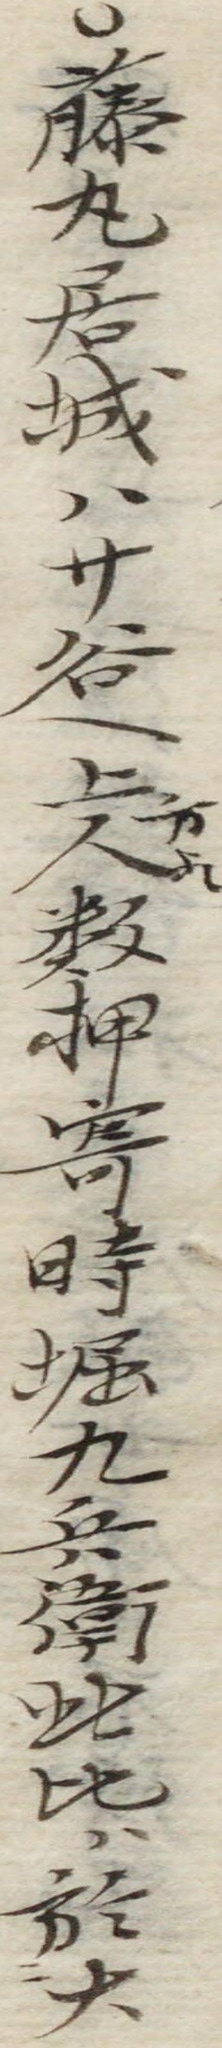〇藤丸居城ハサ谷ヘ上方ヵ人数押寄時堀九兵衛此比ハ於大
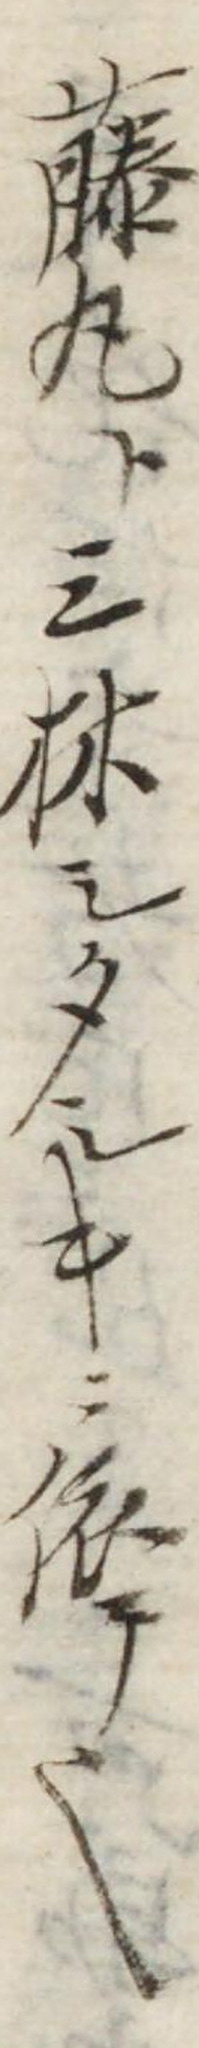藤丸ト三林シタシキニ依テ也
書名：聞見雑録
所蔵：Ishikawa Prefectural Library
